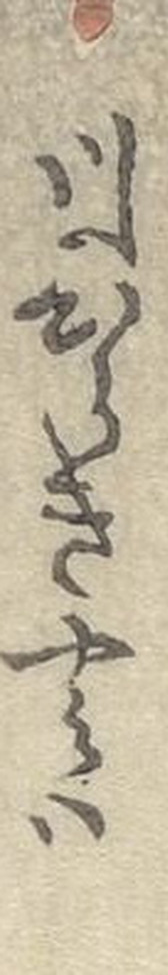川ひらきやみは
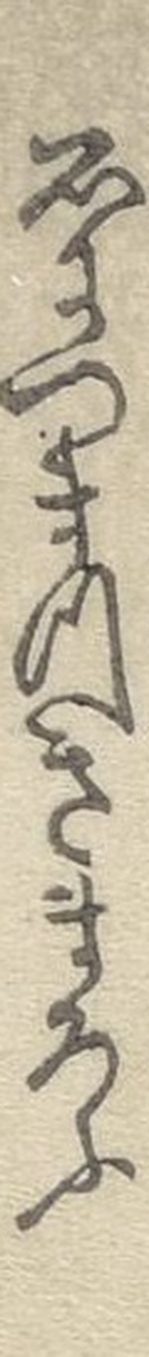石につまつきまろふ
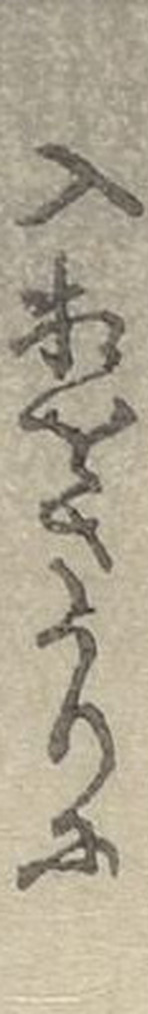入相をさかりに
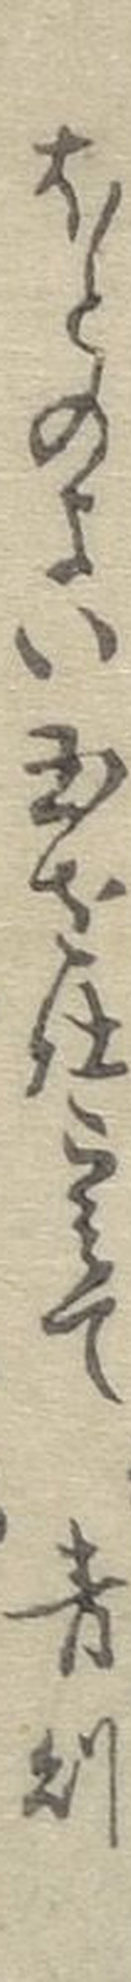ほとのよい玉を仕こみて神風や
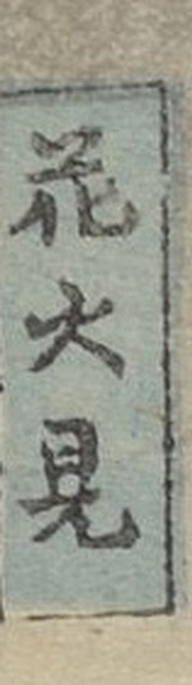花火見

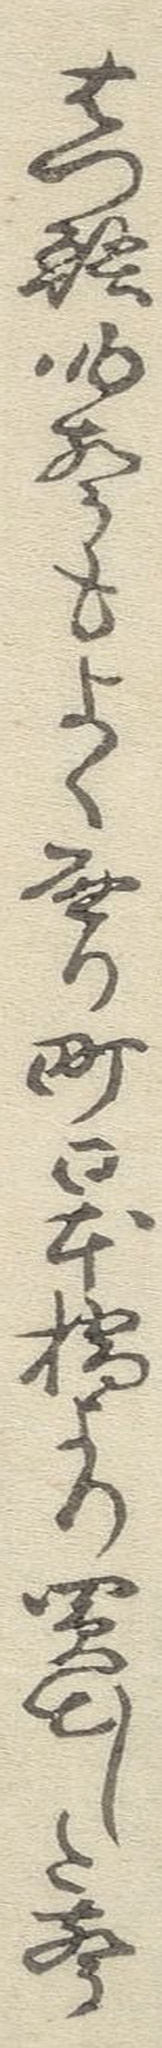はつ鰹呼声もよく通り町日本橋より買出した声
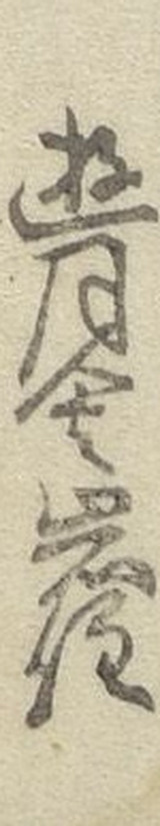遊月舎岩住
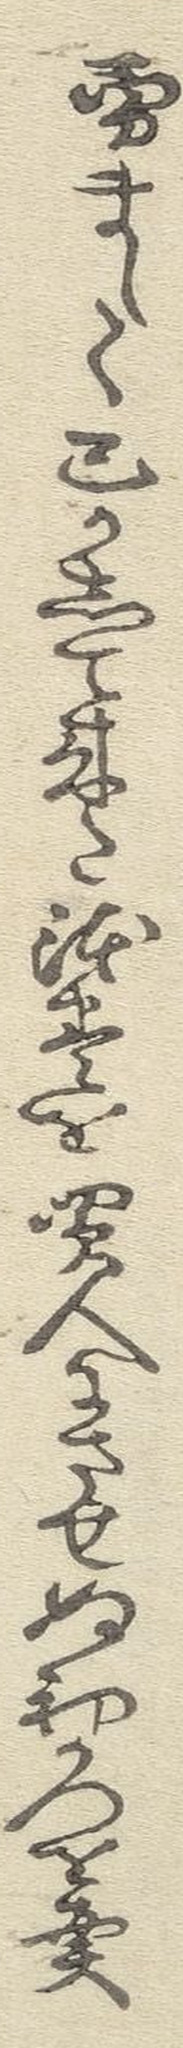勇ましく己かして来た鉢巻を買人にさせぬ初か

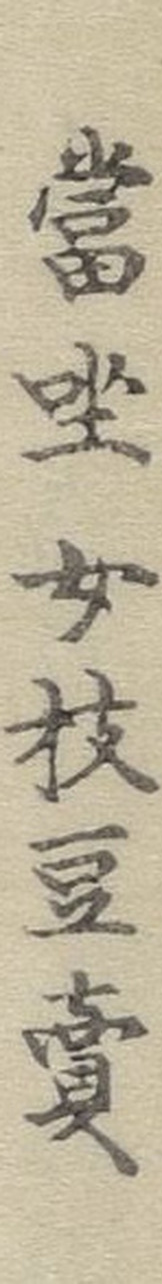当座女枝豆売
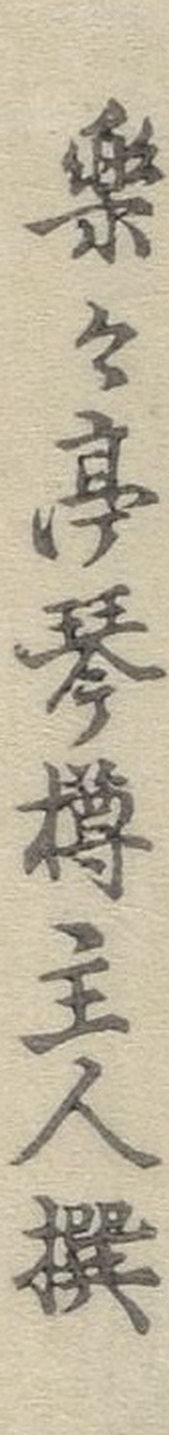楽々亭琴樽主人撰
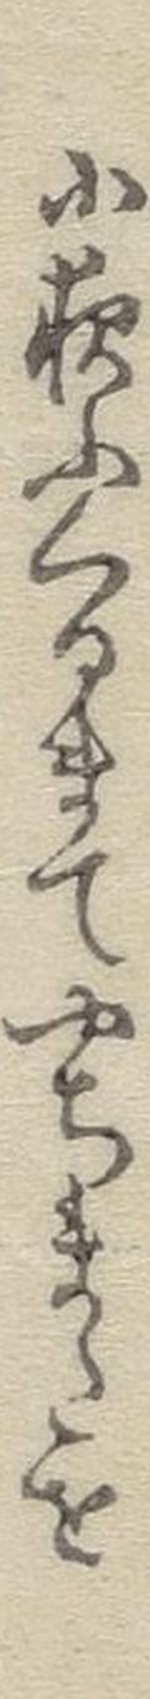小夜ふくるまでやちまたを
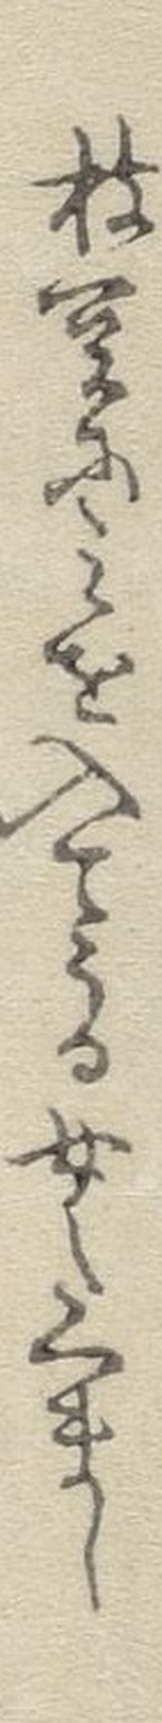枝豆にみを入てうる女たくまし
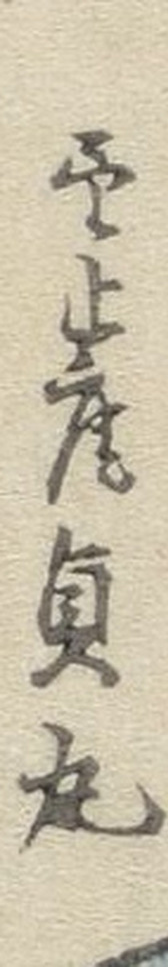望止庵貞丸
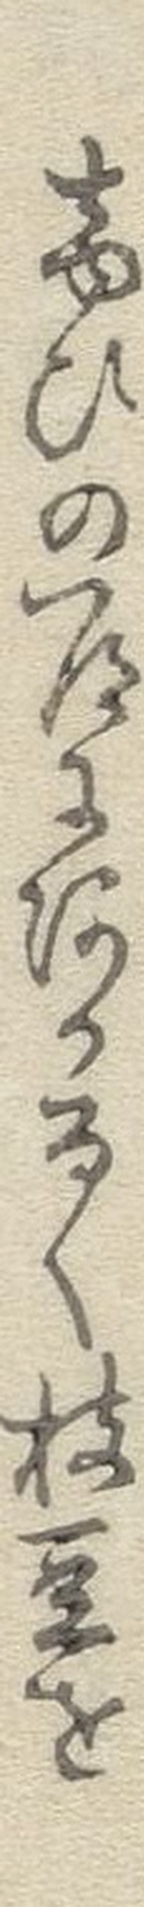商ひの道にあかるく枝豆を
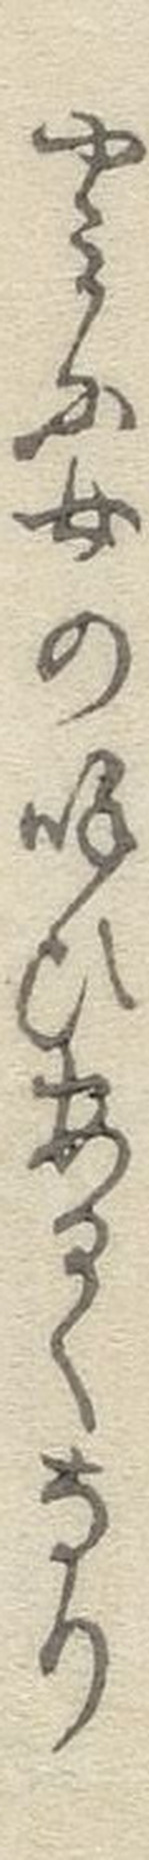やみに女の呼ひあるくなり
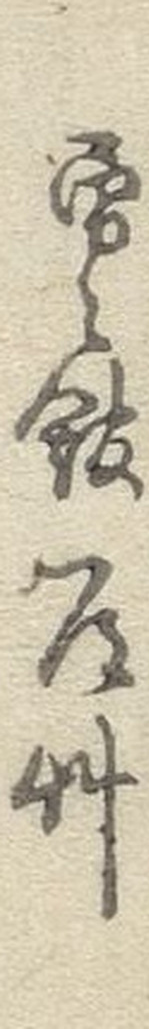勇々館道草
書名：Picture Album of People with Kyōka (Light Verse) (Kyōka shiki jinbutsu 狂歌四季人物)
